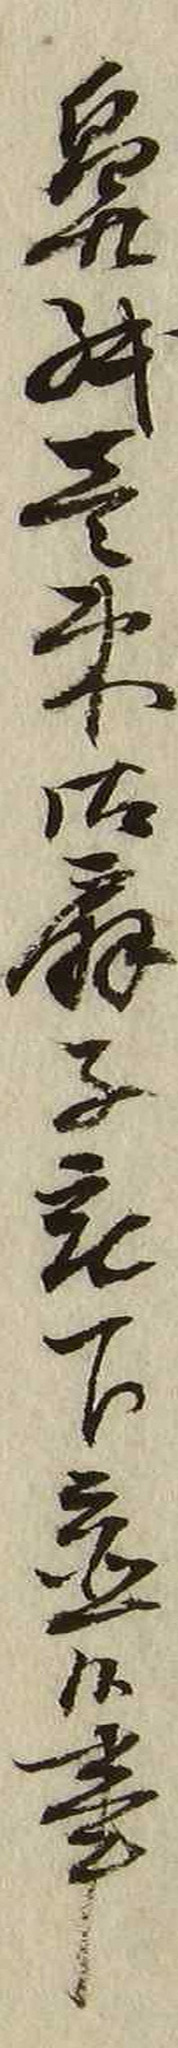鼻紙壱束御扇子被下置候事
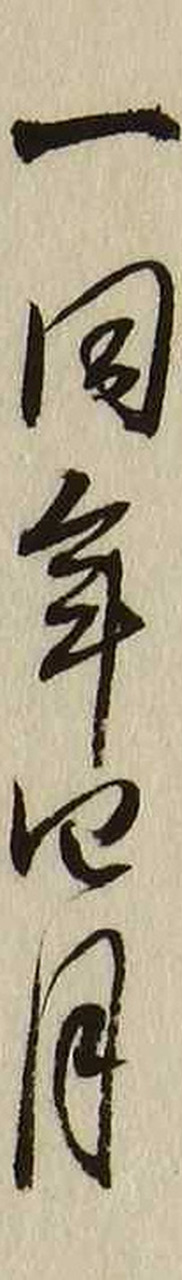一同年四月
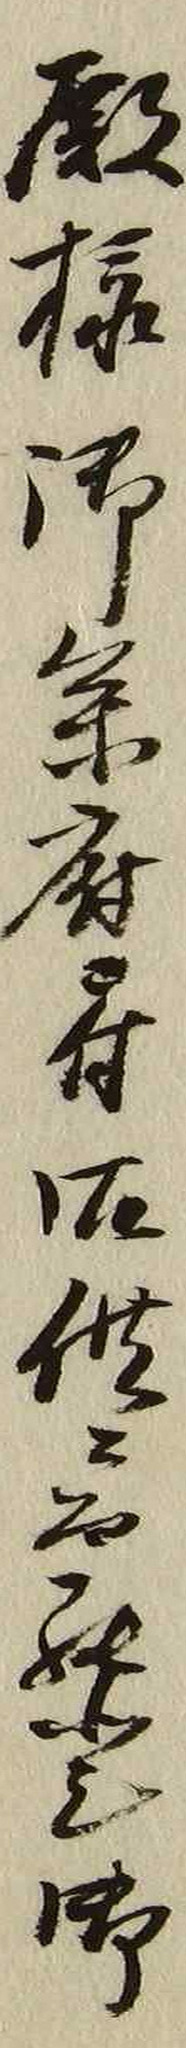殿様御参府ニ付御供ニ而罷登御
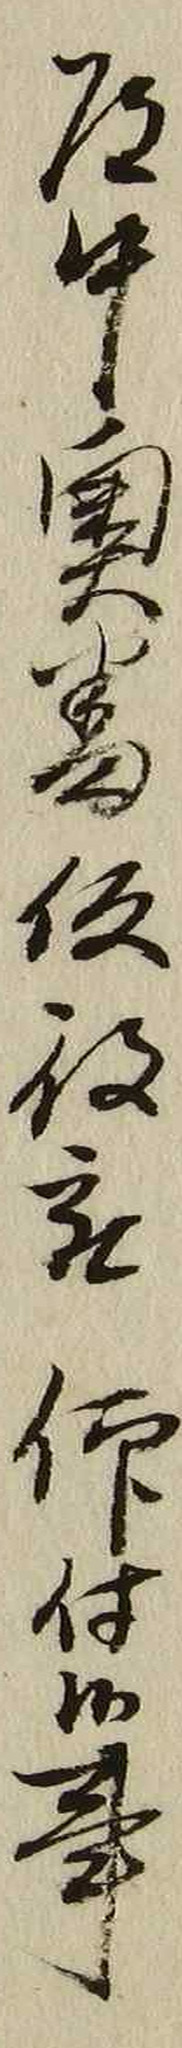道中奥番仮役被仰付候事
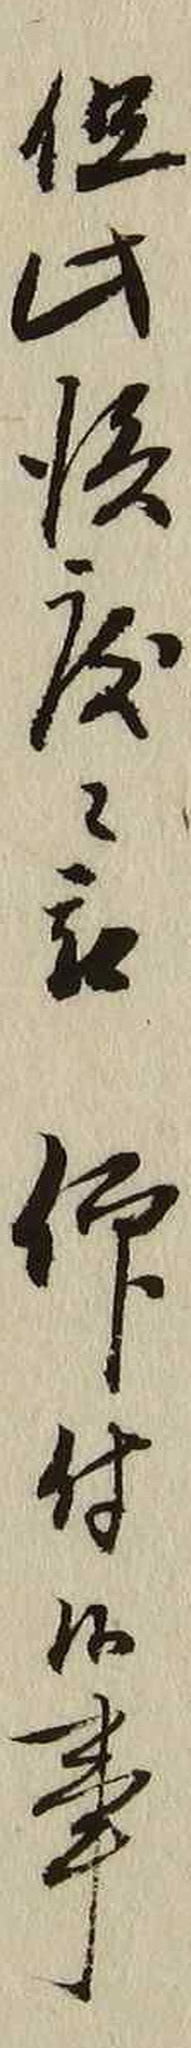但此後度々被仰付候事
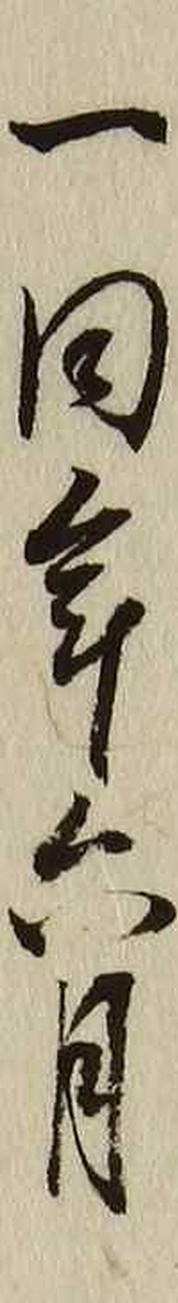一同年六月
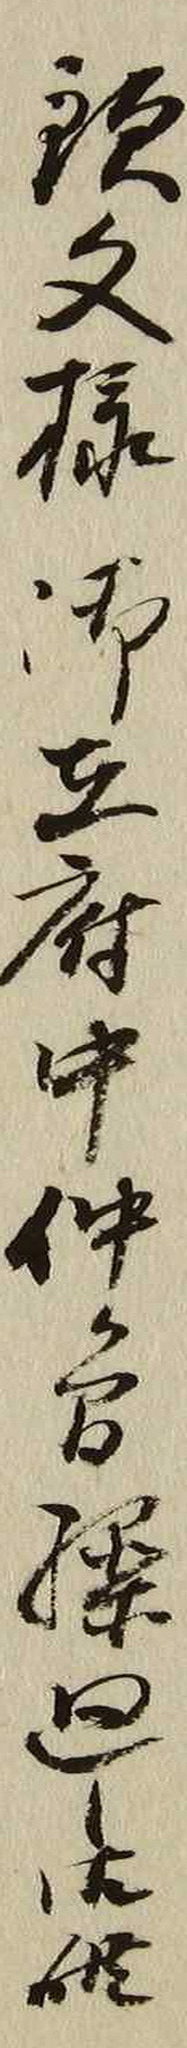欽文様御在府中仲ケ間繰廻し御供
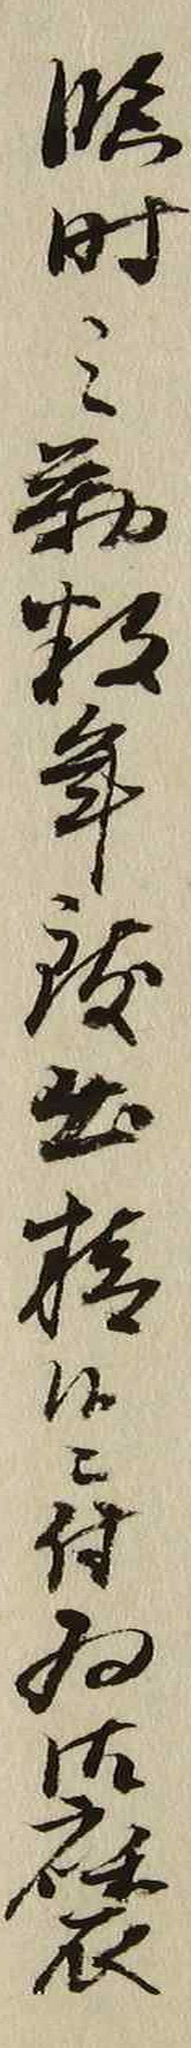臨時之勤数年致出精候ニ付為御褒
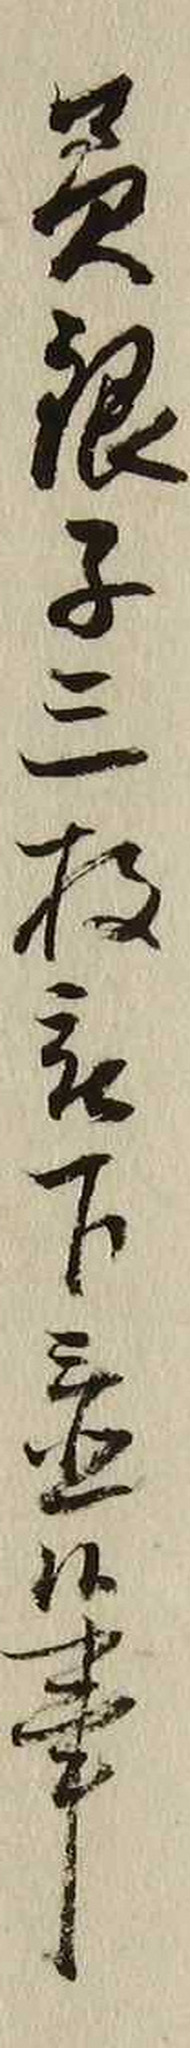美銀子三枚被下置候事
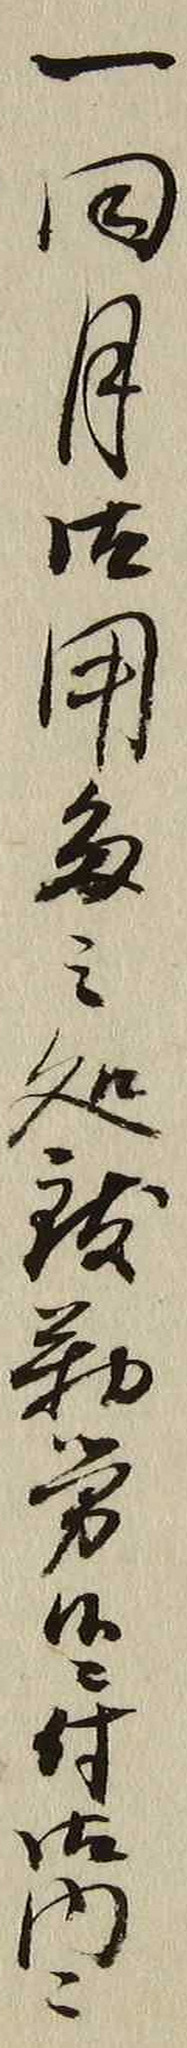一同月御用多之処致勤労候ニ付御内々
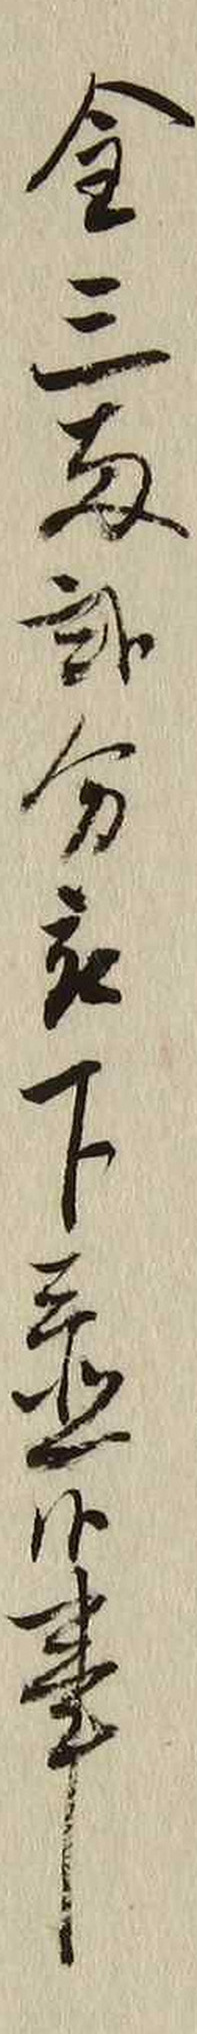金三両弐分被下置候事
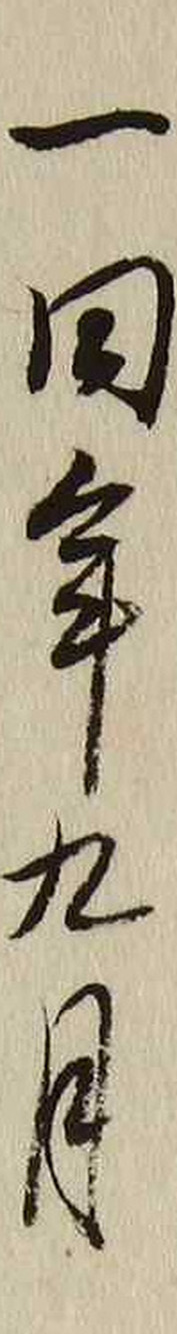一同年九月
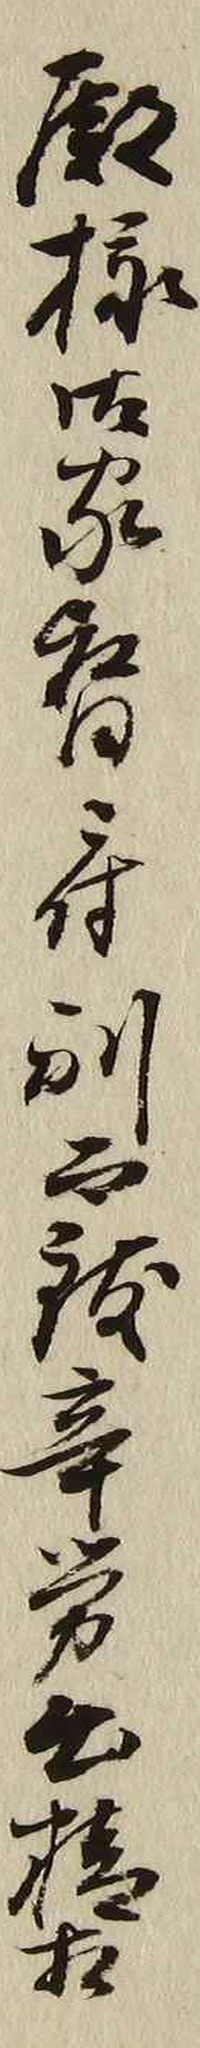殿様御家督ニ付別而致辛労出精相
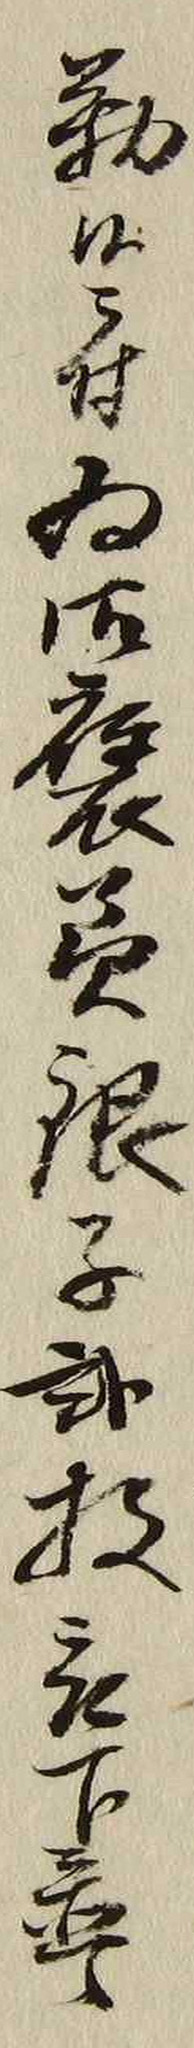勤候ニ付為御褒美銀子弐枚被下置候
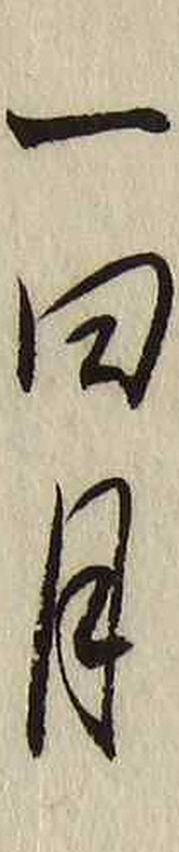一同月
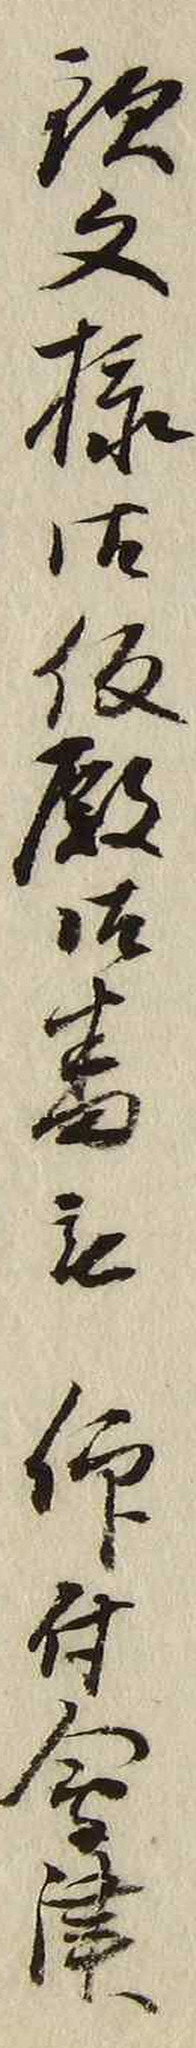欽文様御仮殿御番被仰付会津へ
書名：諸士系譜　巻之356　す之部6
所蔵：会津若松市立会津図書館
